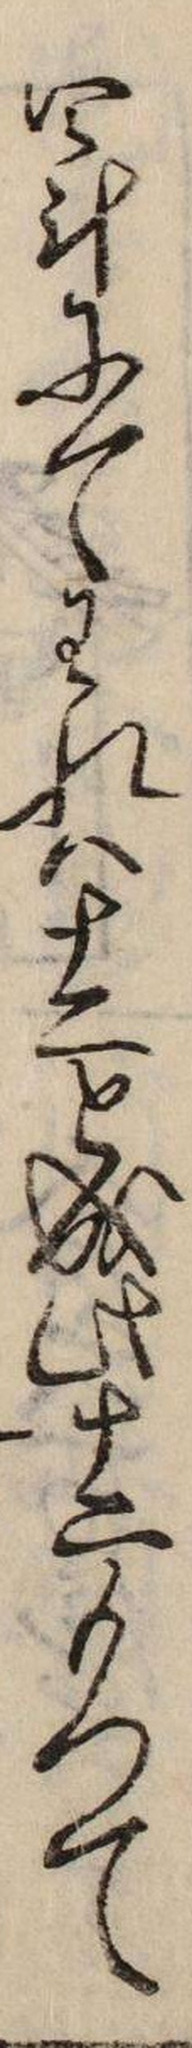四斗にてわれは十二と成此十二もつて
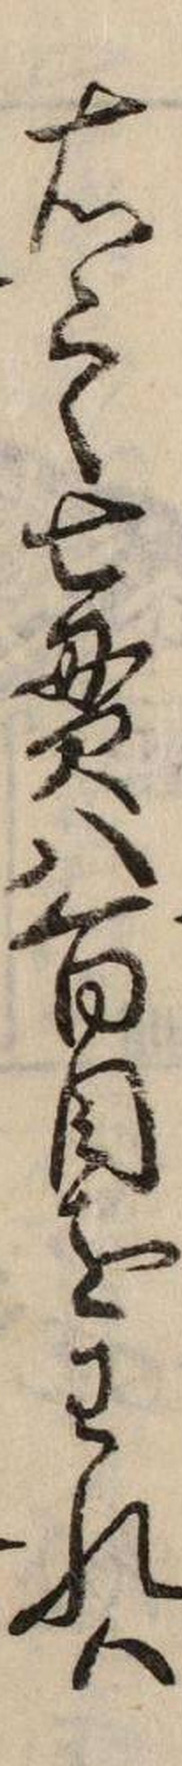右の七貫八百目をわれは
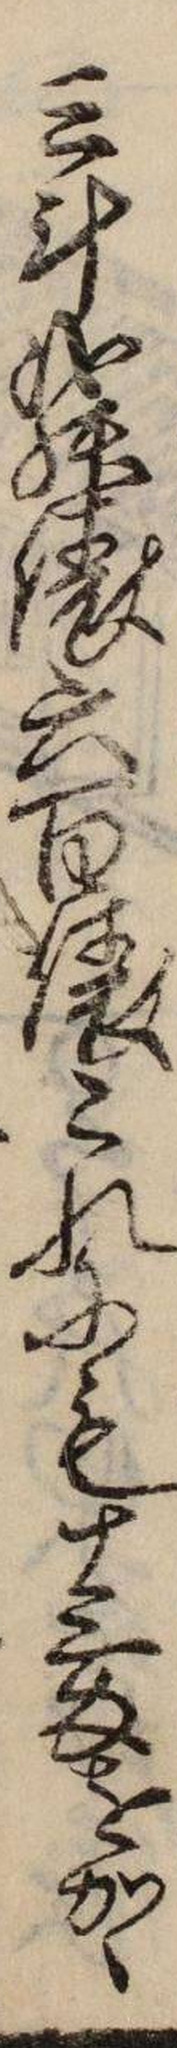三斗弐舛俵六百俵これにも十三両をかく
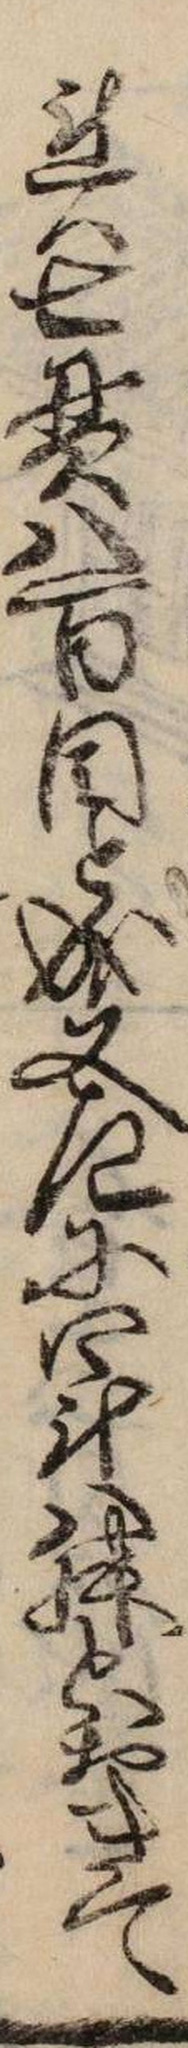れは七貫八百目と成又左に四斗八舛とおきて
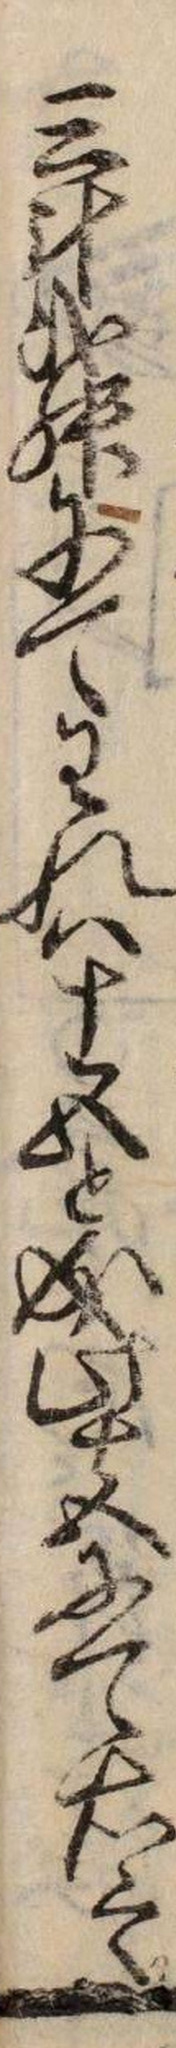三斗弐舛にてわれは十五と成此十五にて右の
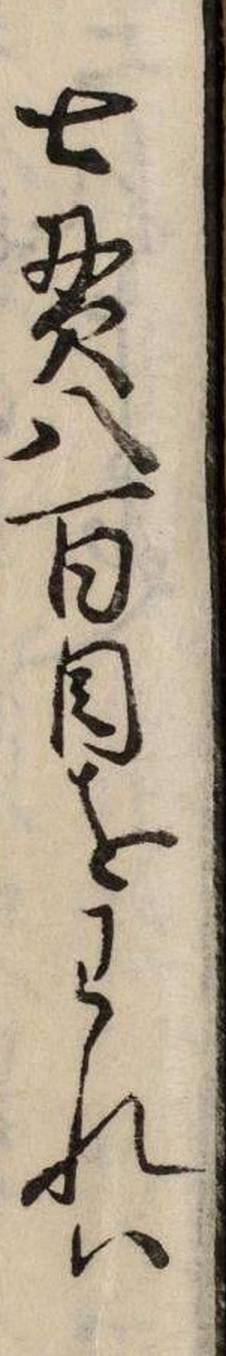七貫八百目をわれは
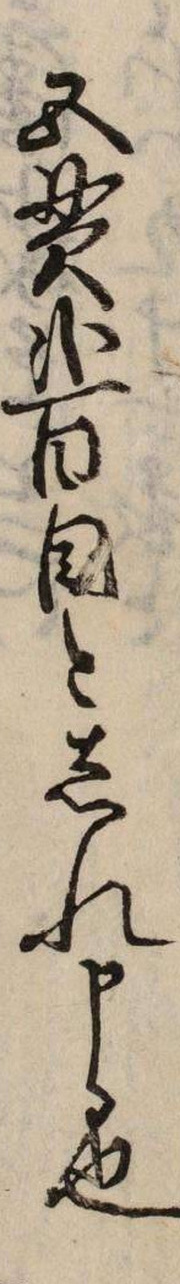五貫弐百目としれ申也
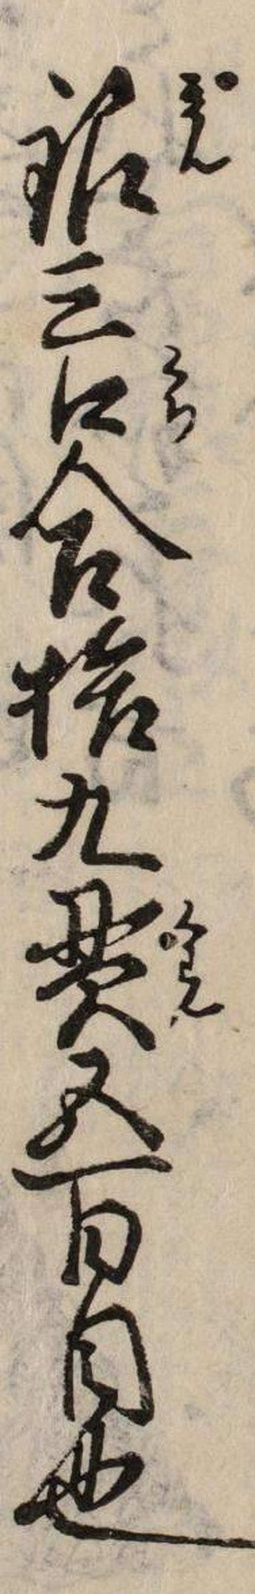銀三口合拾九貫五百目也
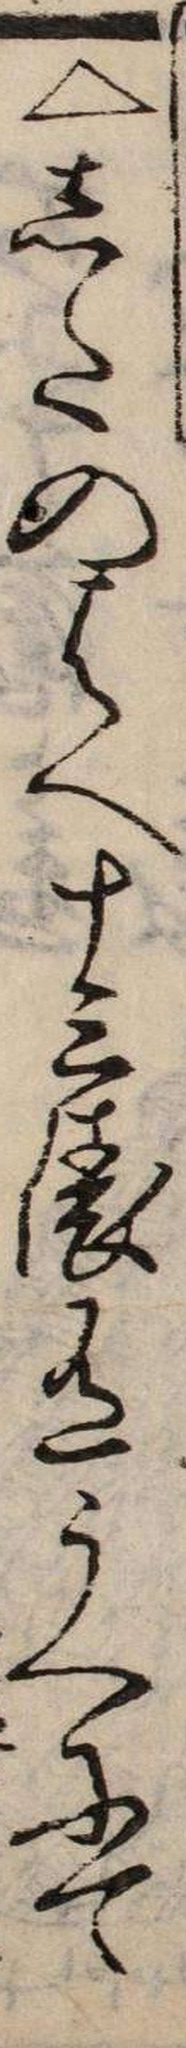△したのはへ十三俵有うへにて
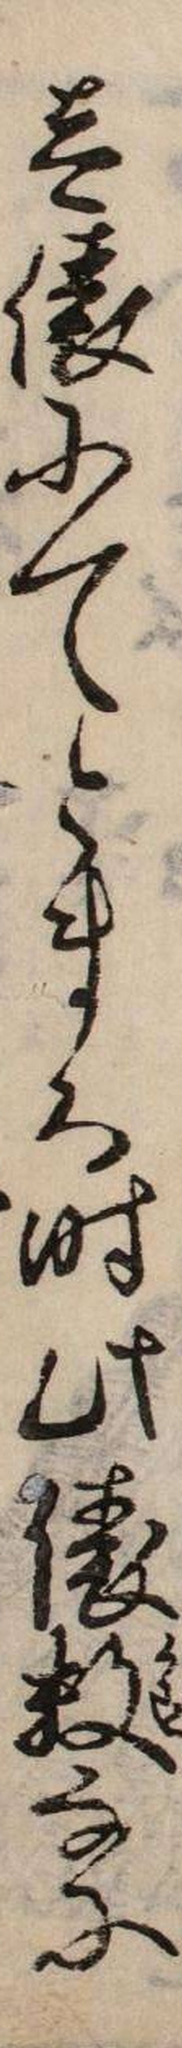一壱俵にてとまる時此俵数なに
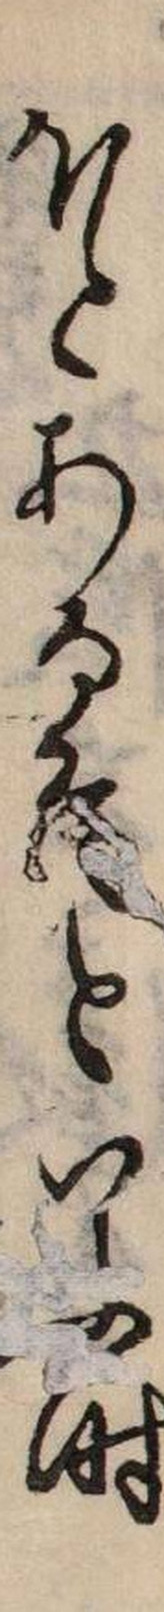ほとあるそといふ時

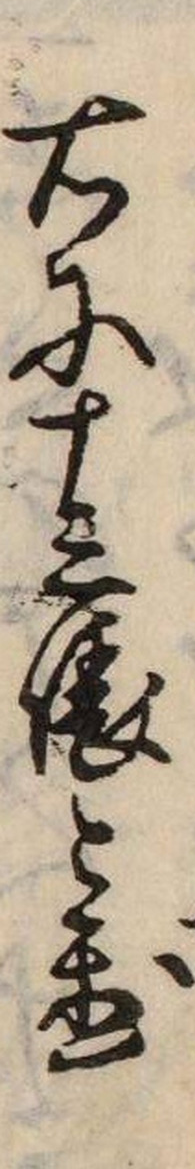右に十三俵と置
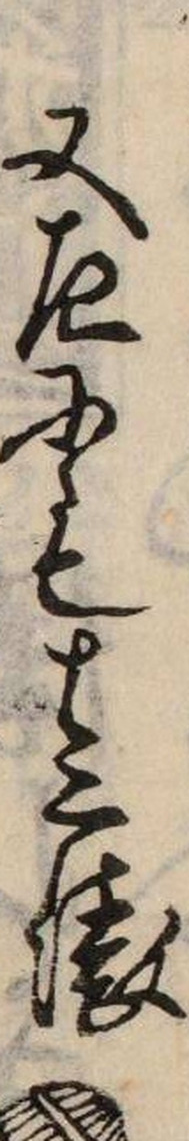又左にも十三俵
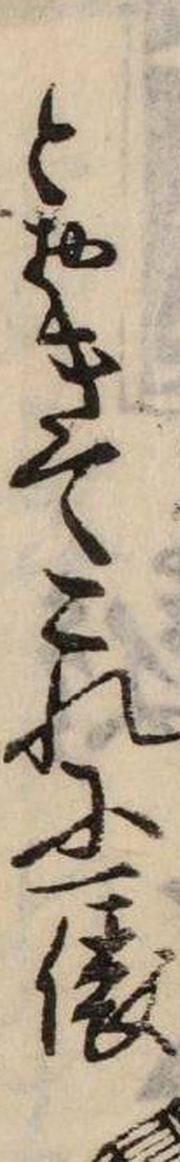とおきてこれに一俵
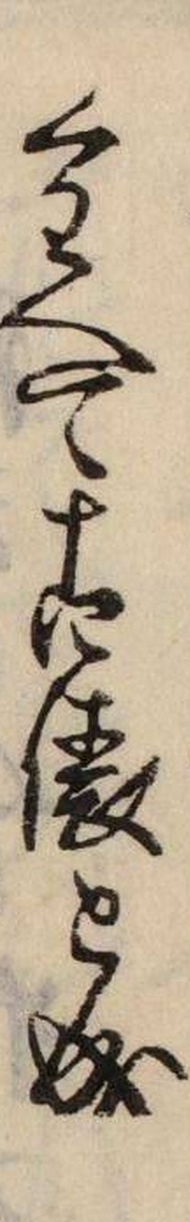くわへて十四俵と成
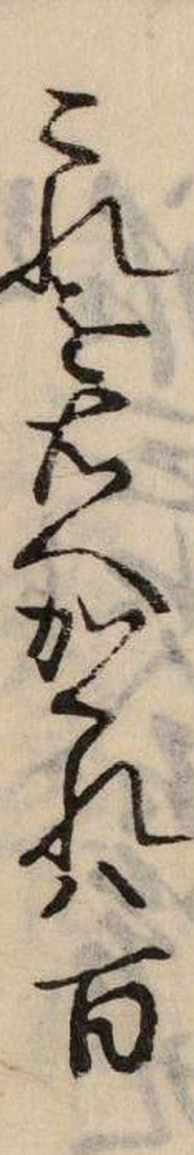これを右へかくれは百
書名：塵劫記（寛永11年自跋、京都府立京都学・歴彩館追貴8）
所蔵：京都府立京都学・歴彩館 国文学研究資料館
